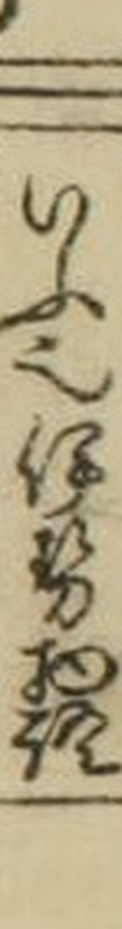いふ也伊勢物語
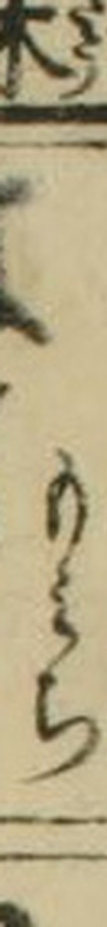もみち
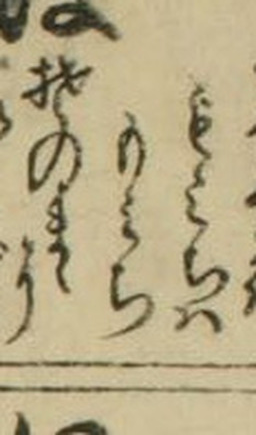もみち
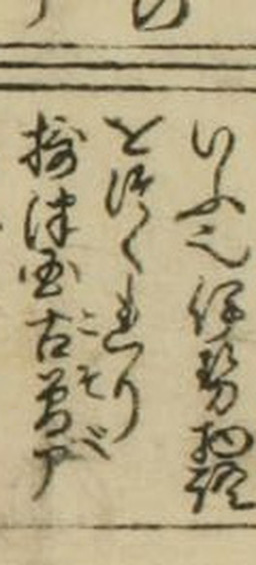をつくれり
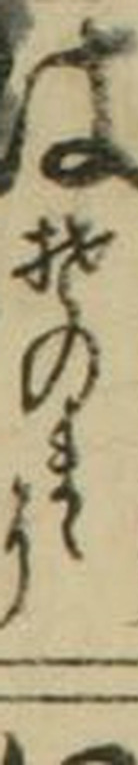そのまゝ
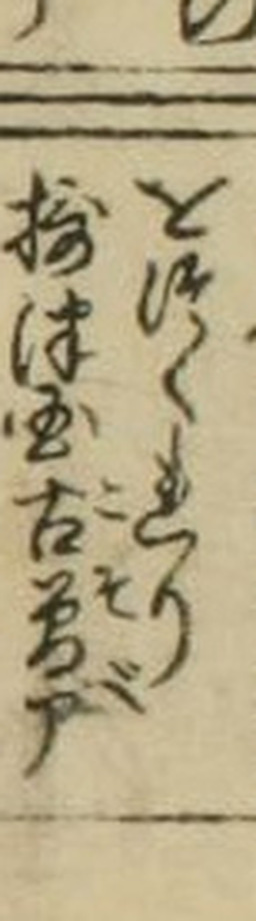摂津国古曽戸
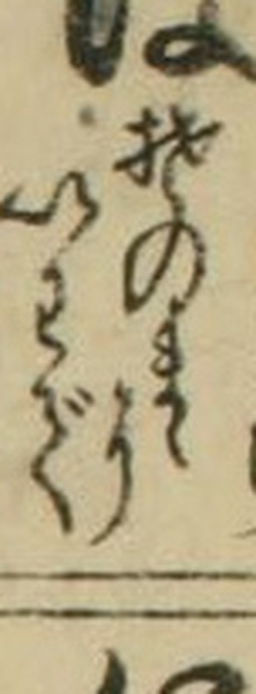いわで
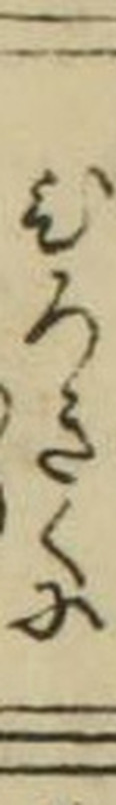ひろきくに
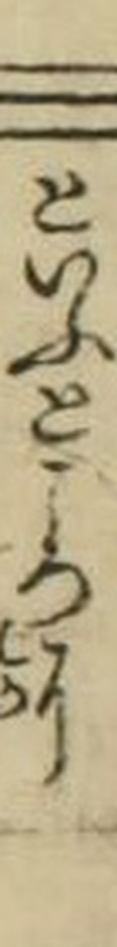といふところに
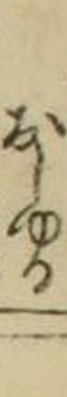おしゆる
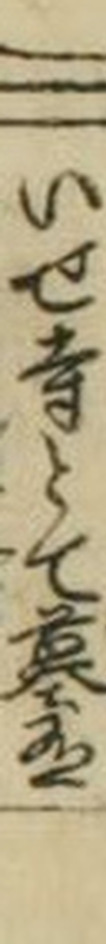いせ寺とて墓置
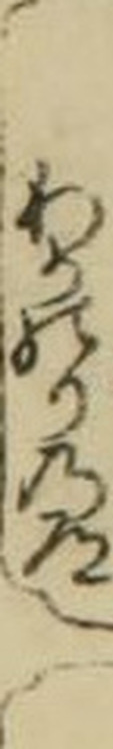わかのりの道
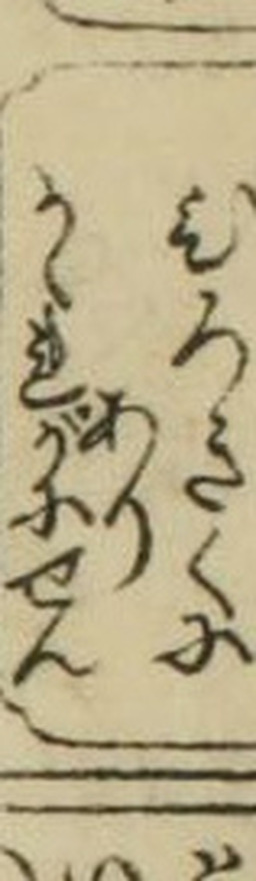かくれがにせん
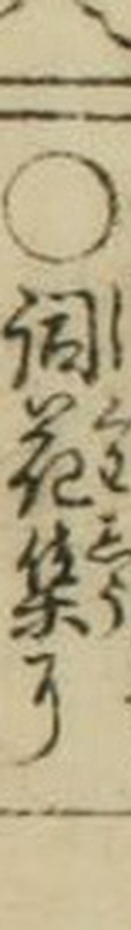◯詞花集に
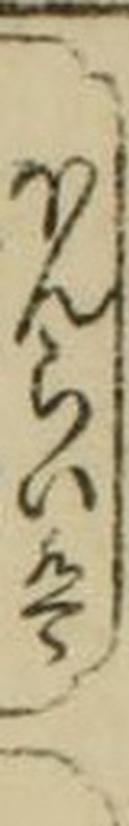ほんらいは
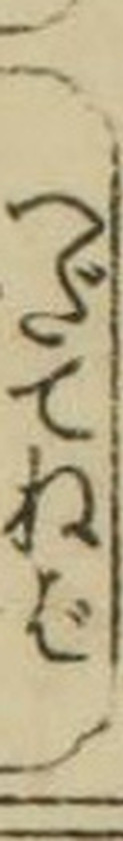へだてねば
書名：女源氏教訓鑑
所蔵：東京学芸大学附属図書館
